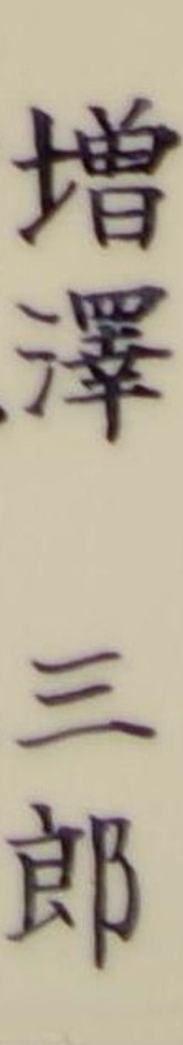増澤三郎
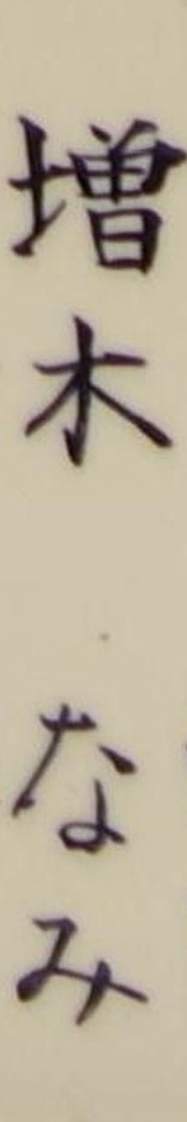増木なみ
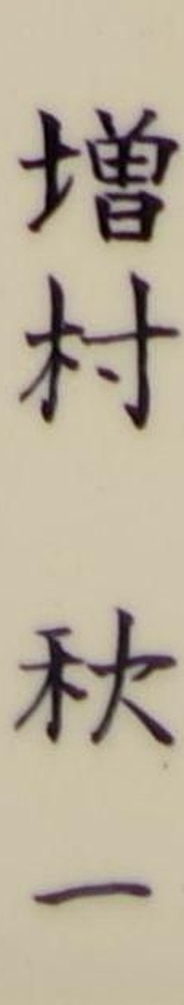増村秋一
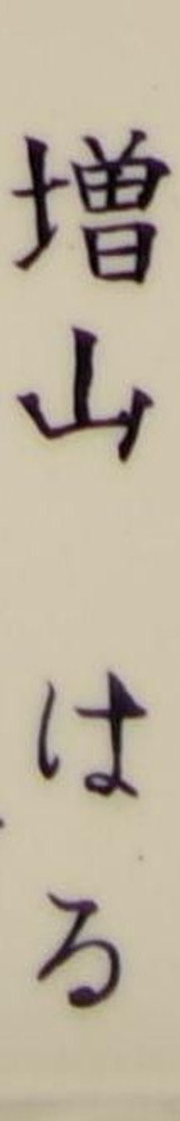増山はる
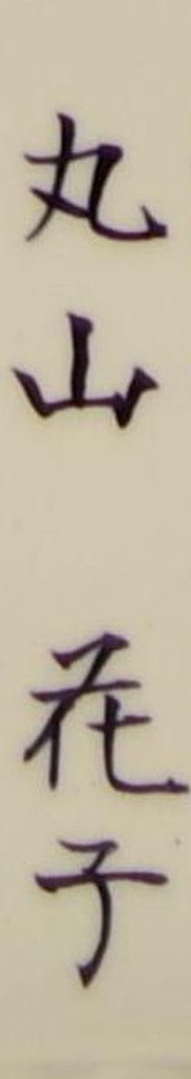丸山花子
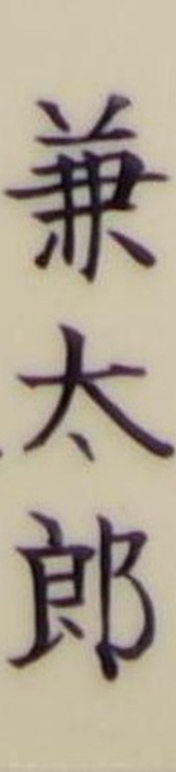兼太郎
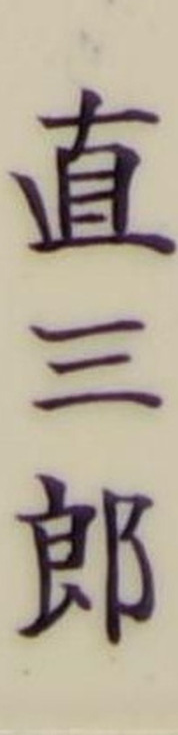直三郎
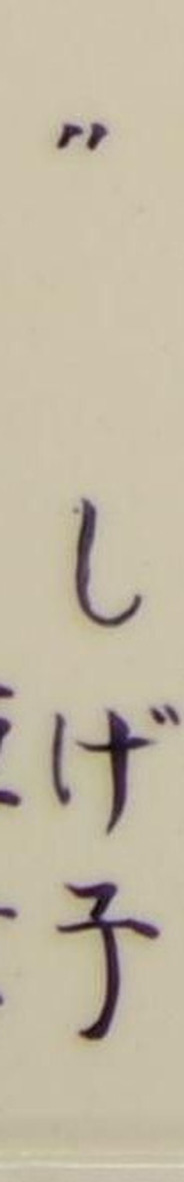しげ子

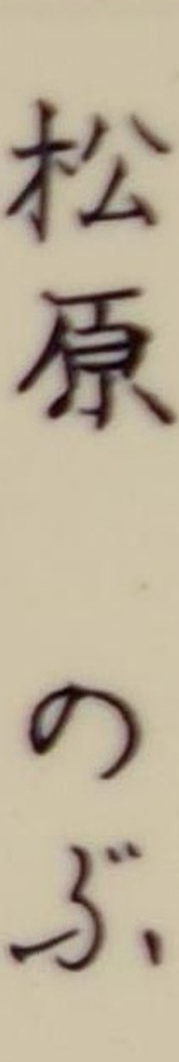松原のぶ
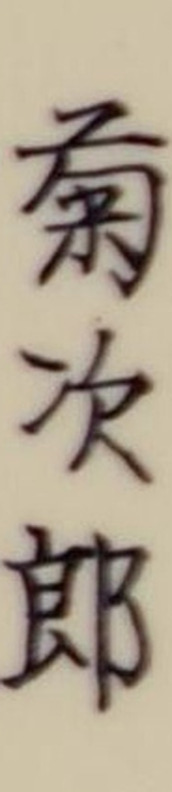菊次郎
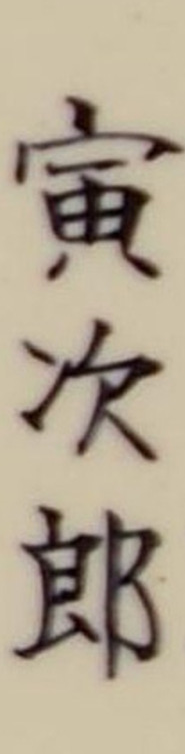寅次郎
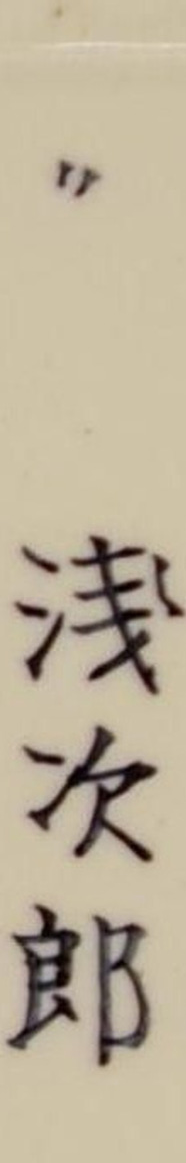浅次郎
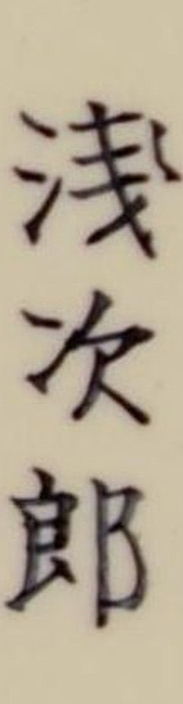浅次郎
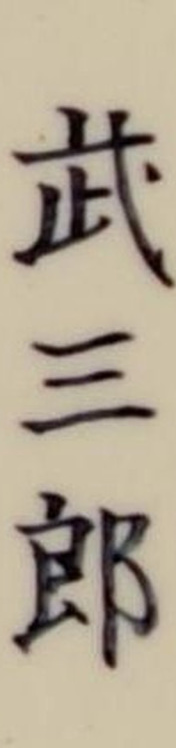武三郎
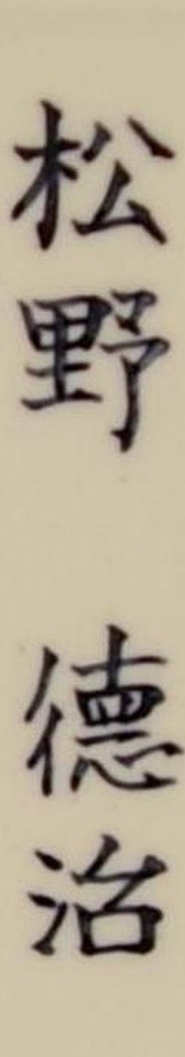松野徳治
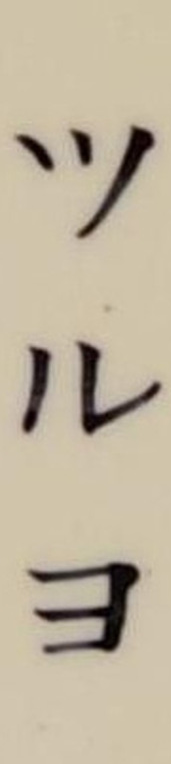ツルヨ
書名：A~D
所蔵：koyasan kongobuji
